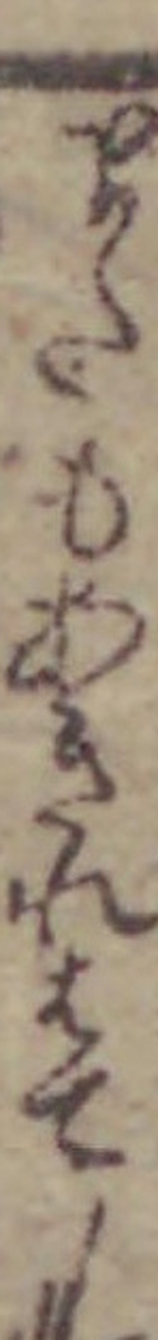またもあきれはて
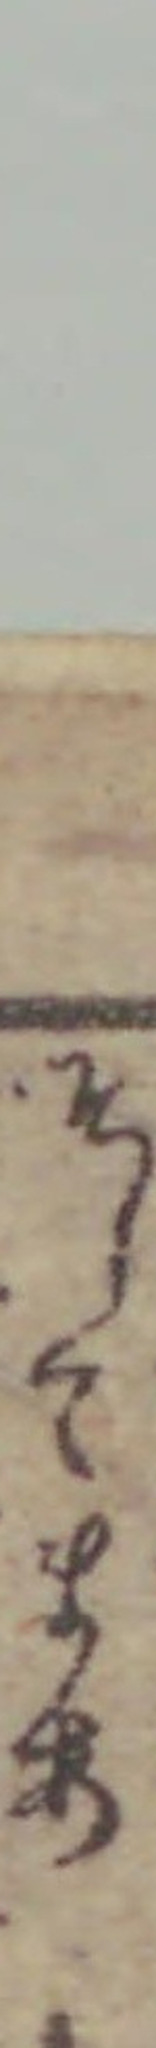そしてまあ
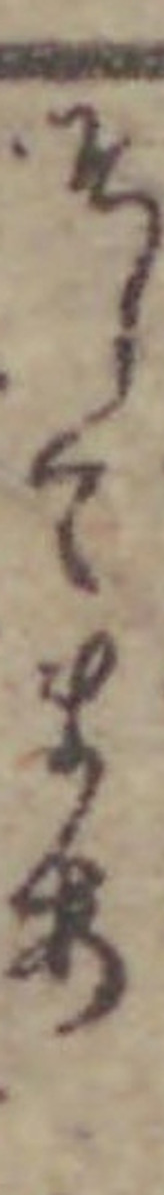そしてまあ
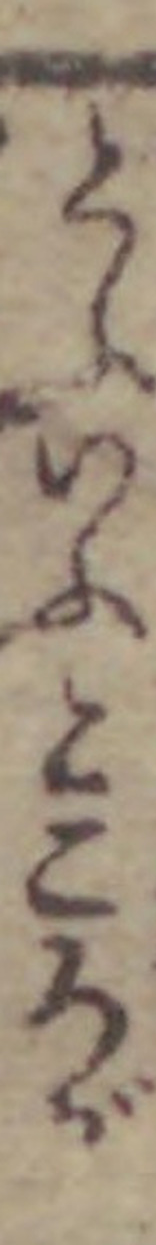どふいふところが
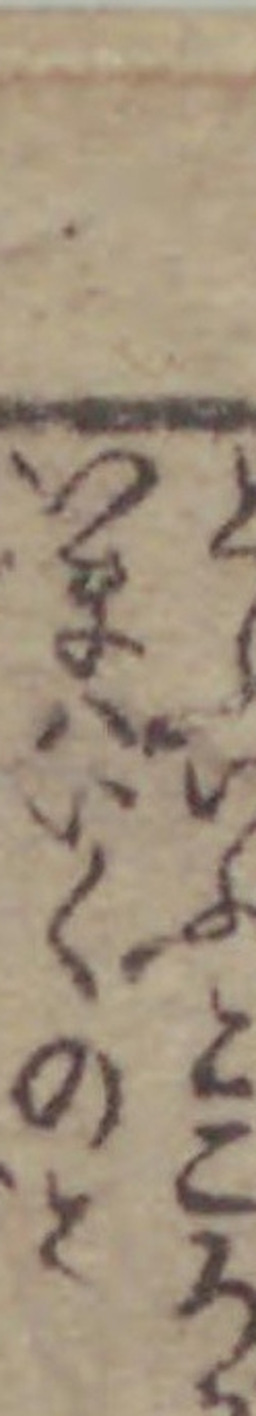いまはいゝのと
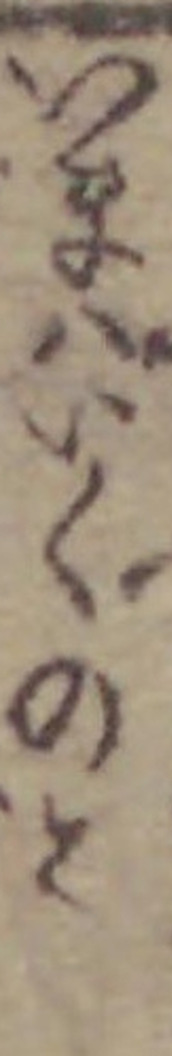いまはいゝのと
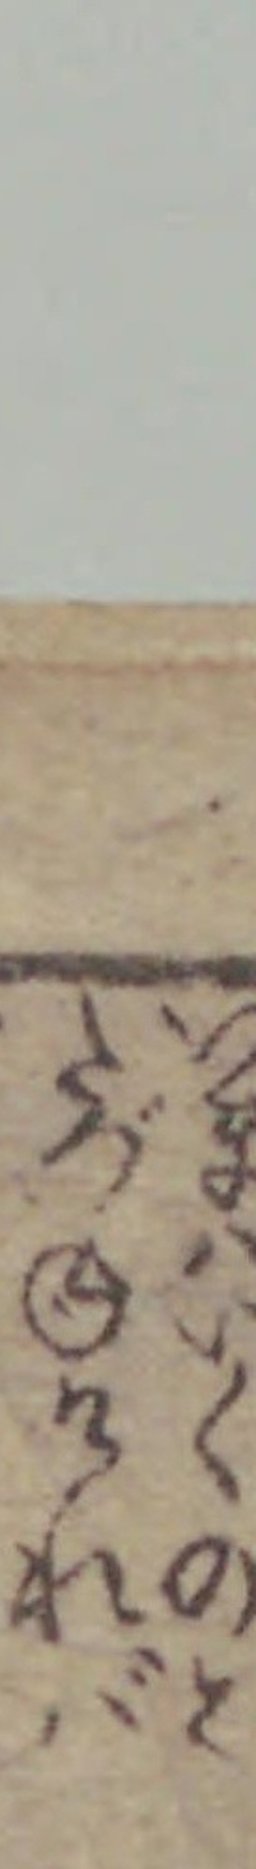たづねければ
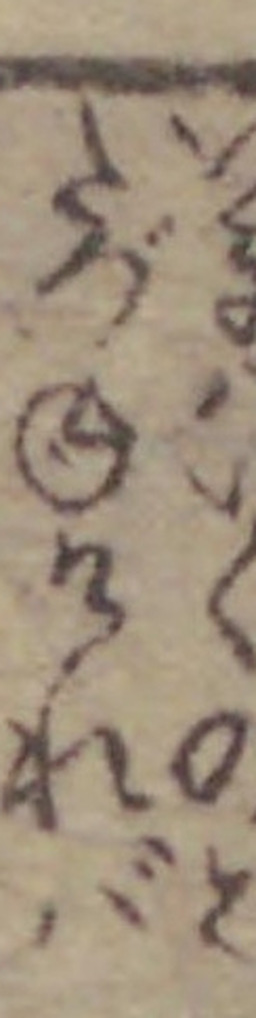たづねければ
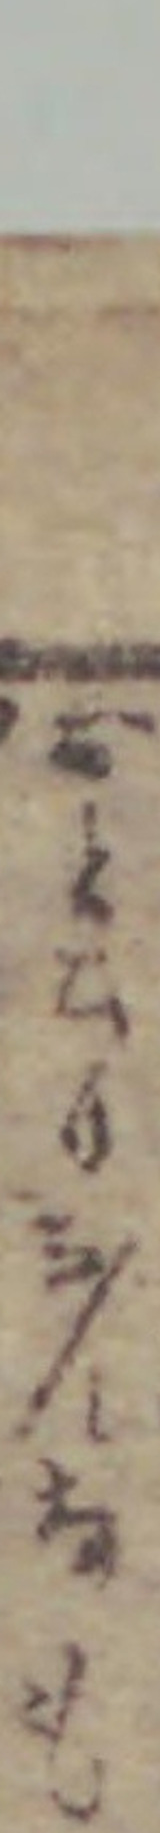おとこもおんなも
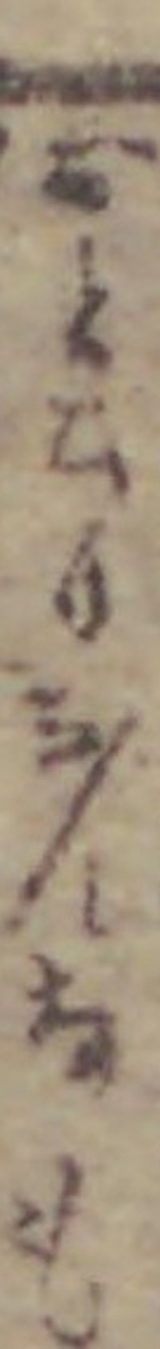おとこもおんなも
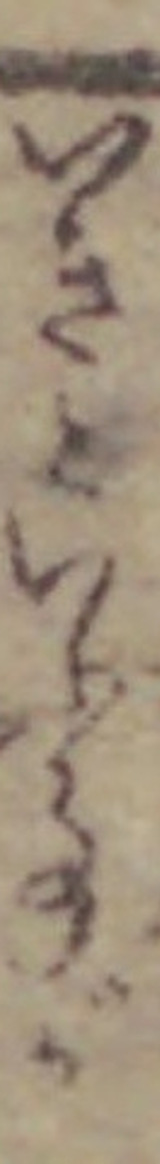いきといふ事が
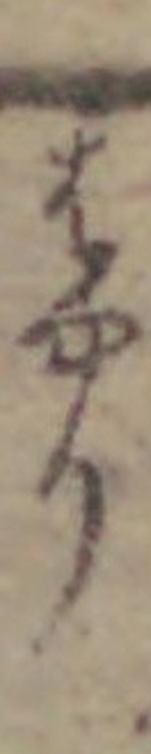はやり
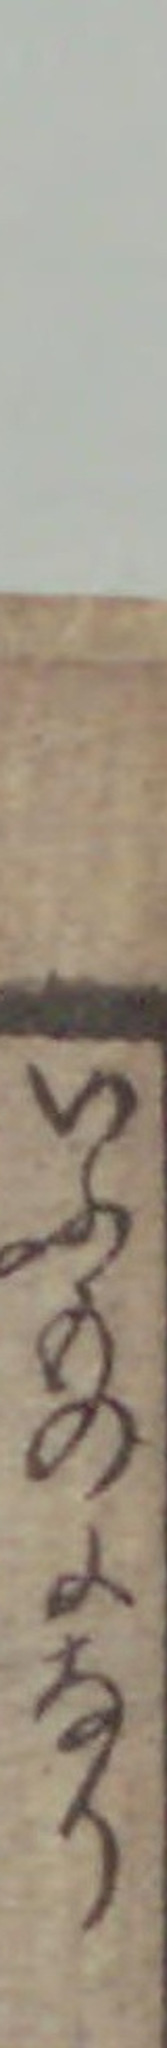いふものになり
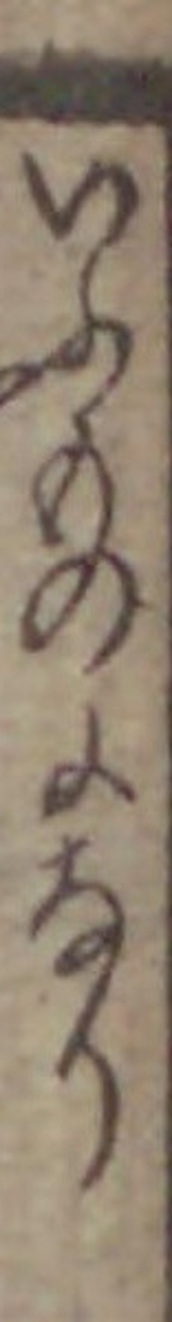いふものになり
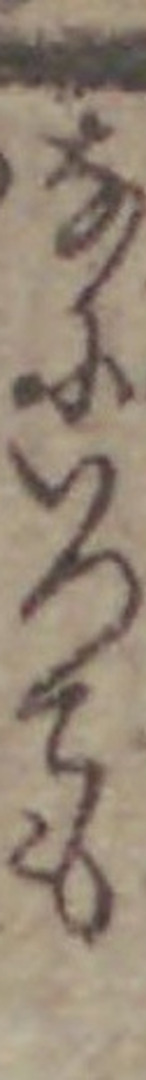なにいつても
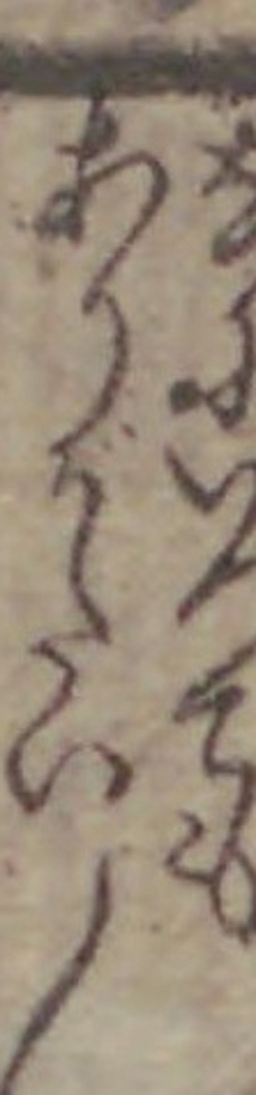ありがたい〳〵と
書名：化物鼻がひしげ 2巻
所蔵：国立国会図書館 National Diet Library, JAPAN
